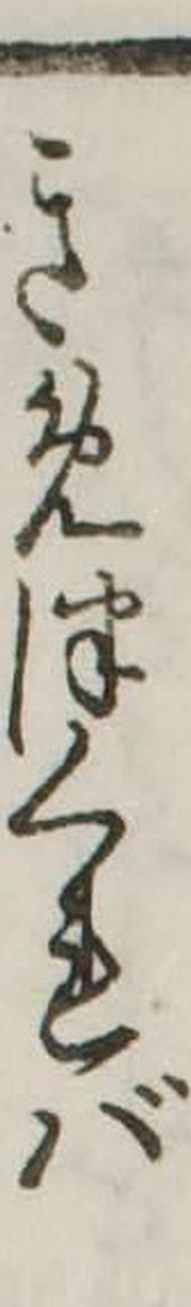きめつくれば
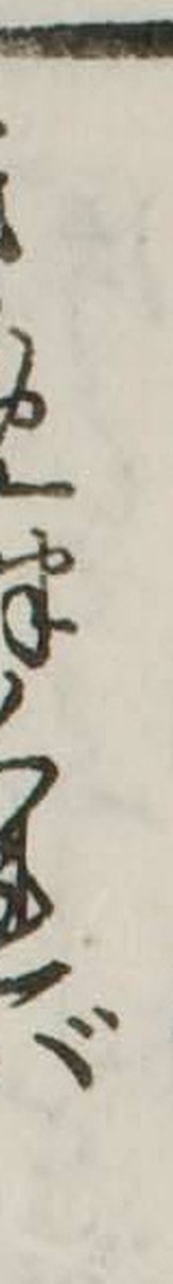きめつくれば
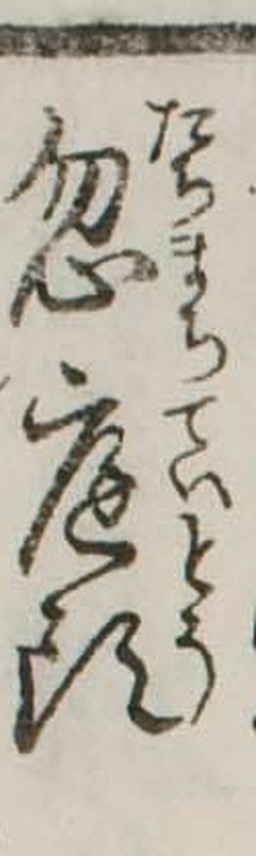忽底頭
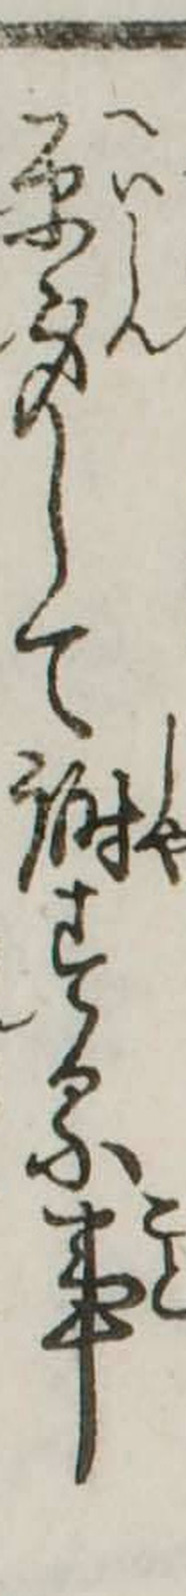平身して謝する事
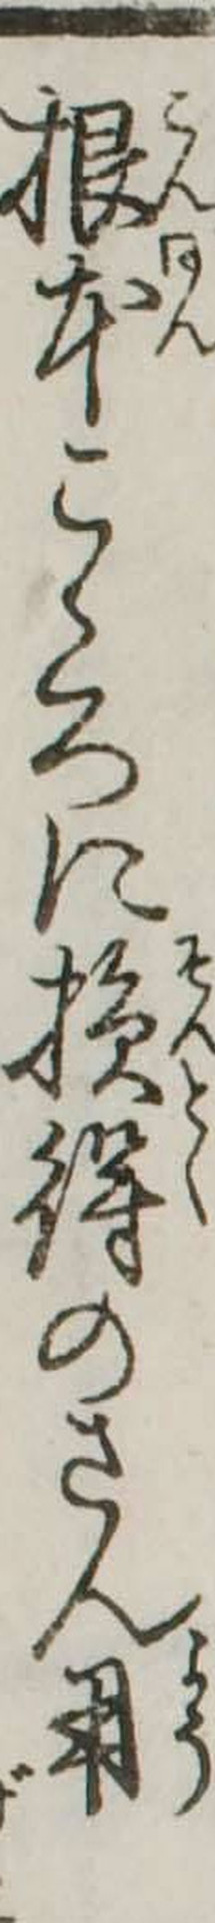根本こゝろに損得のさん用
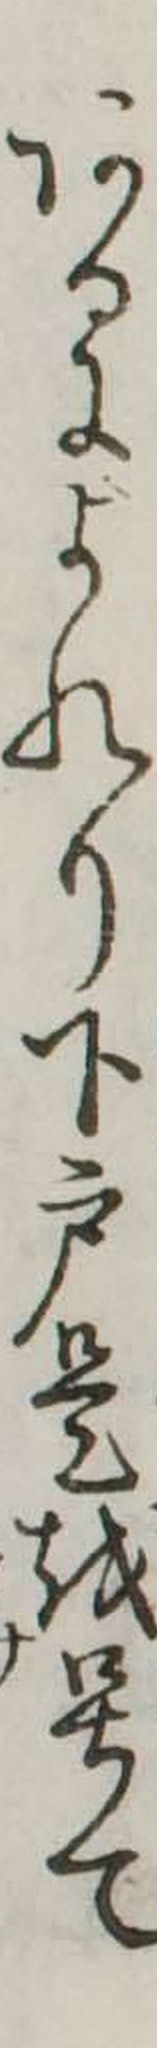あるによれり下戸是を号て
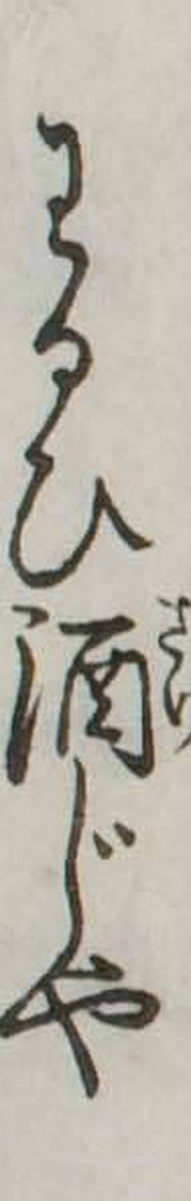わるひ酒じや
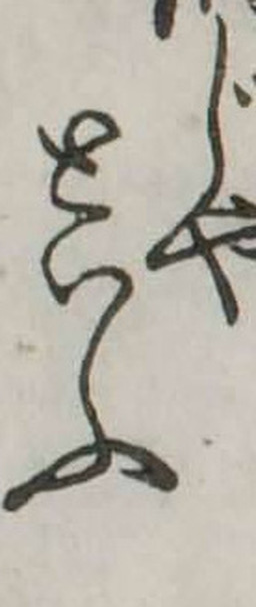といふ

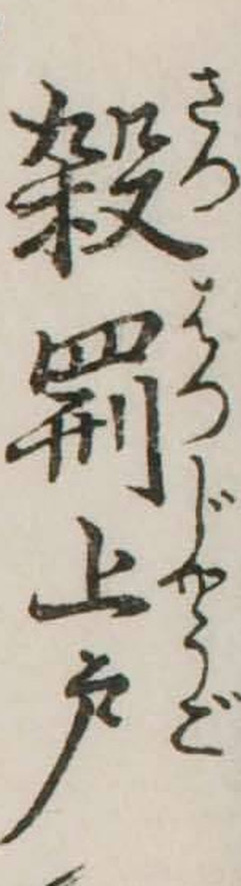殺罰上戸
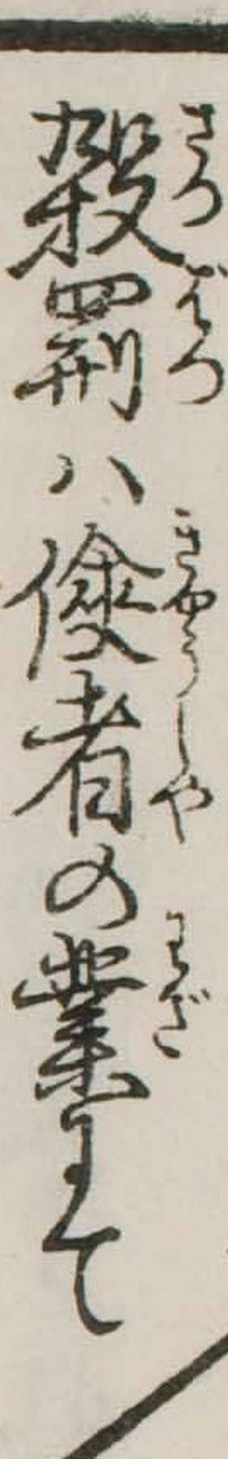殺罰は侠者の業にて
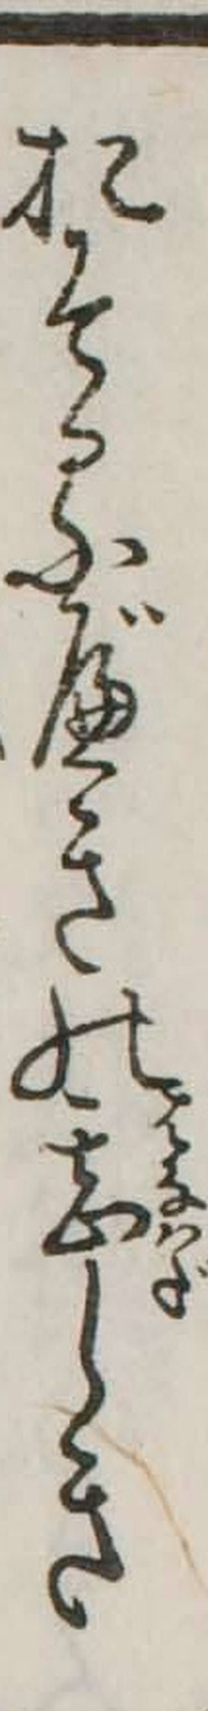おそるべきの甚しき
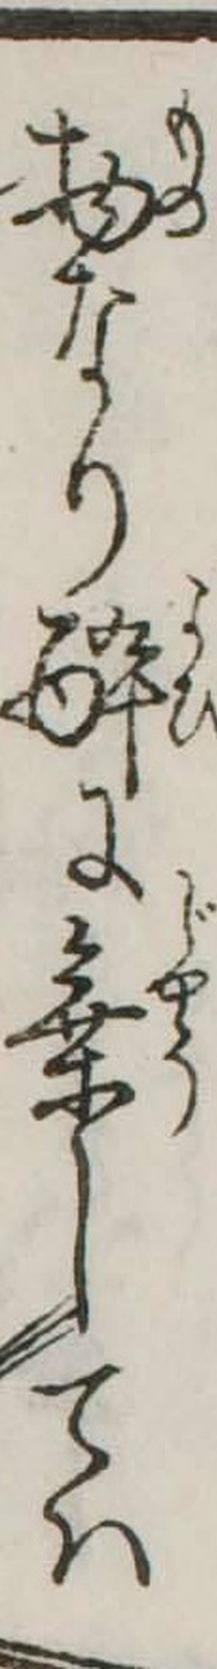物なり酔に乗しては
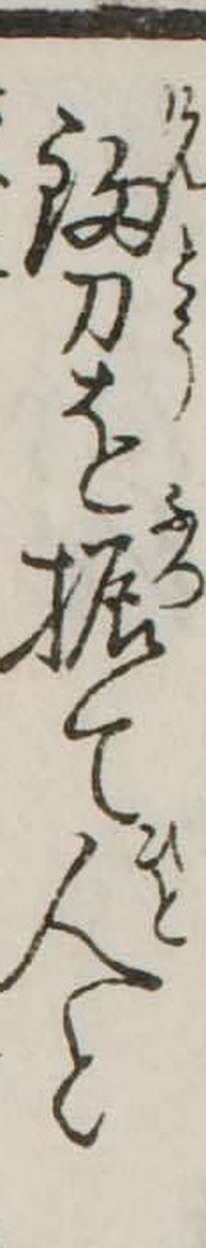釼刀を振て人と
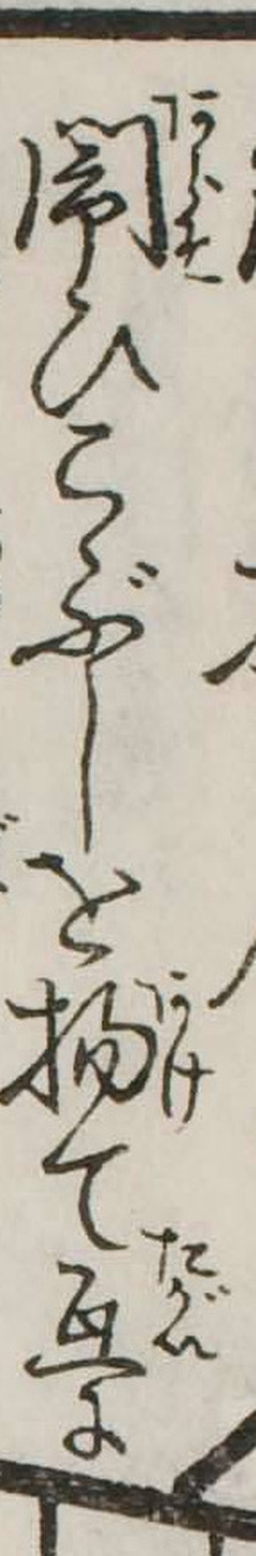閙ひこぶしを揚て互に
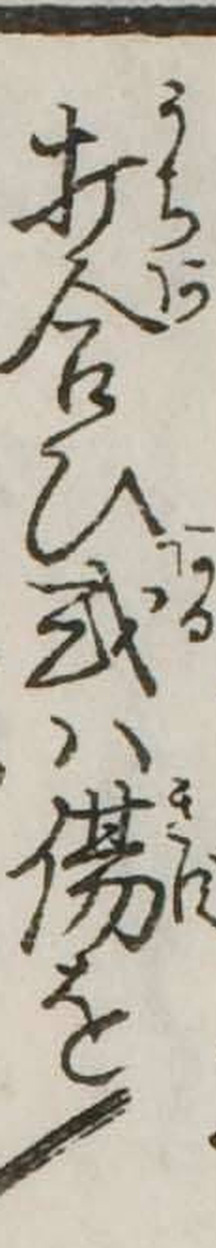打合ひ或は傷を
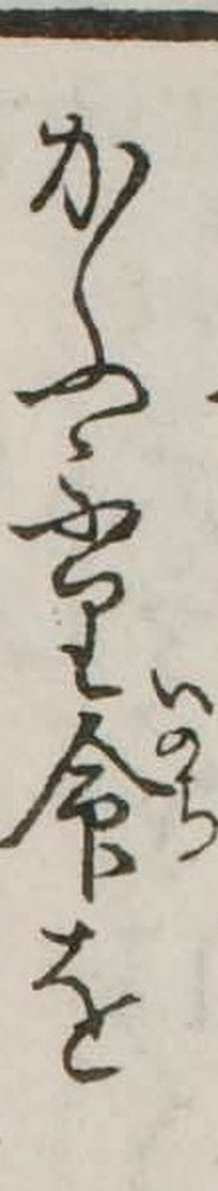かふふり命を
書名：繪本不盡泉
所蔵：国文学研究資料館
